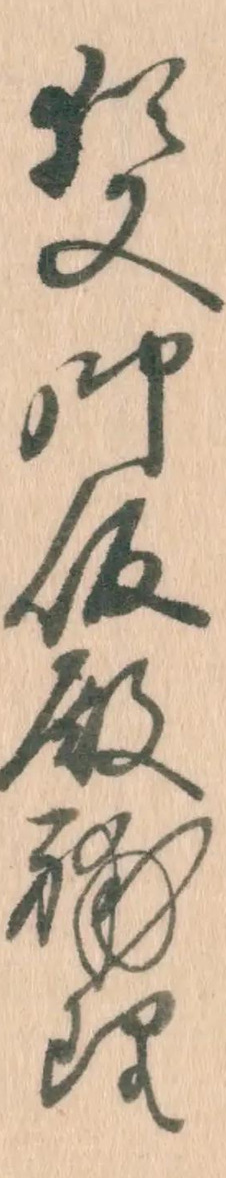猶又御仮殿補理
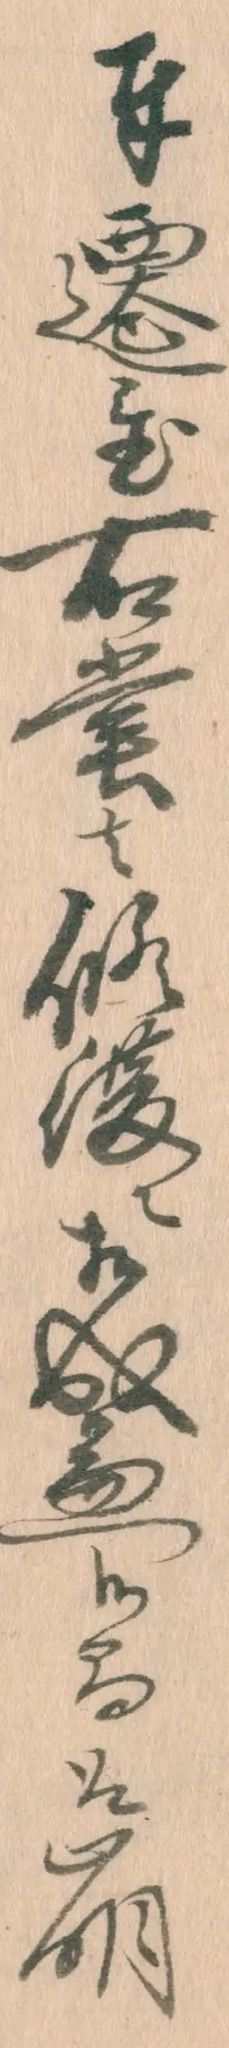奉遷置右堂は修復に相成兼候間取崩
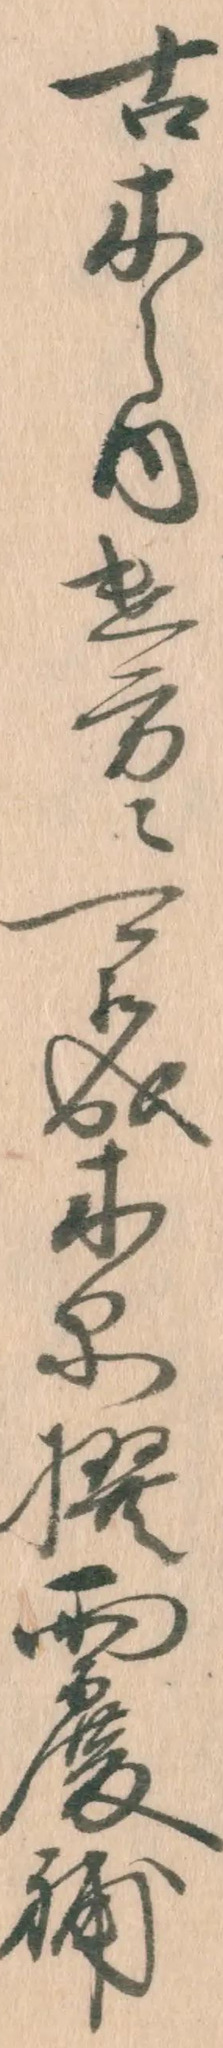古木之内遣方に可相成木品撰雨覆補
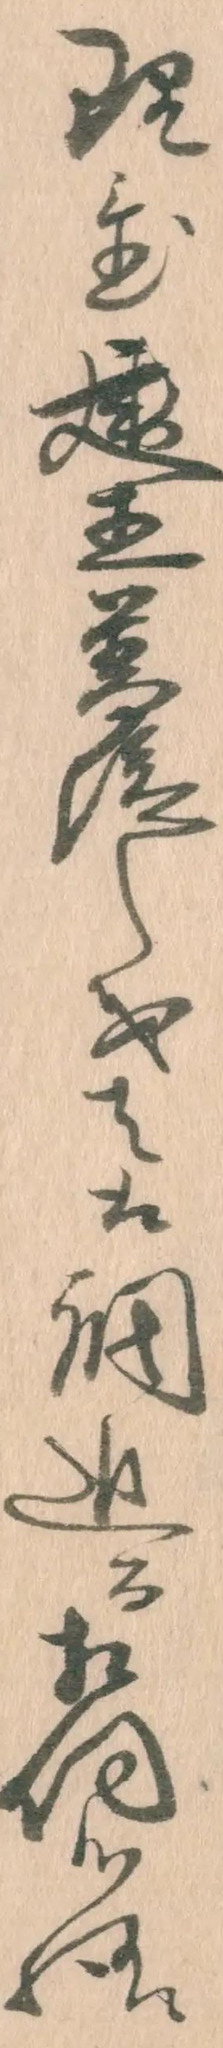理置建直普請之義は取調追而相伺候様
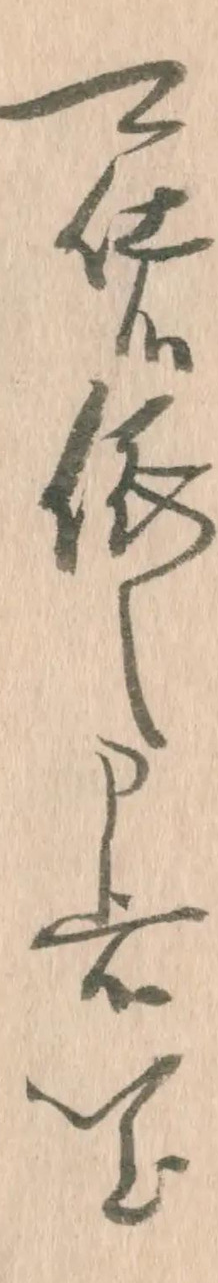可仕候依之申上候以上
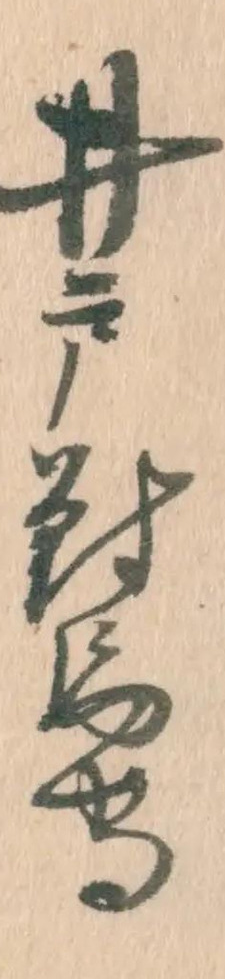三月井戸対馬守
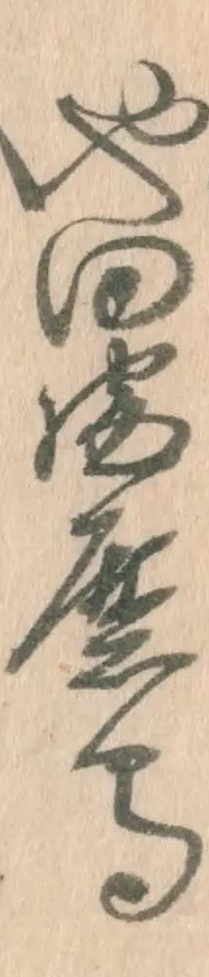池田播磨守

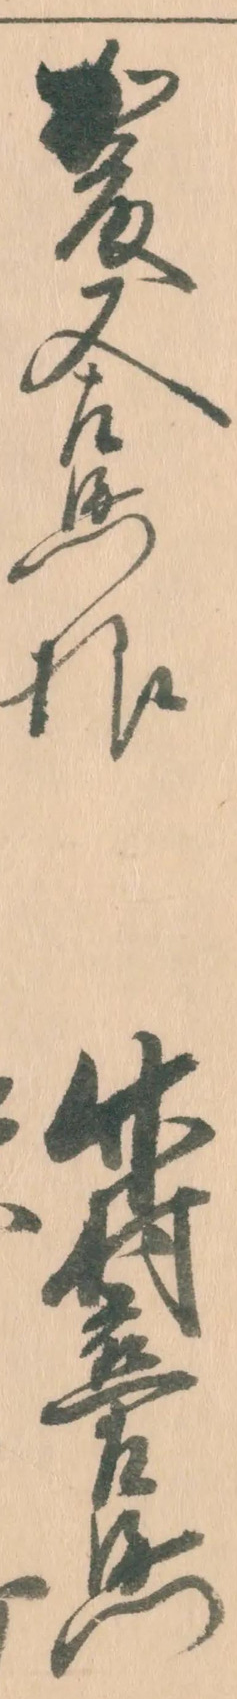│加藤又左衛門様竹村慈左衛門
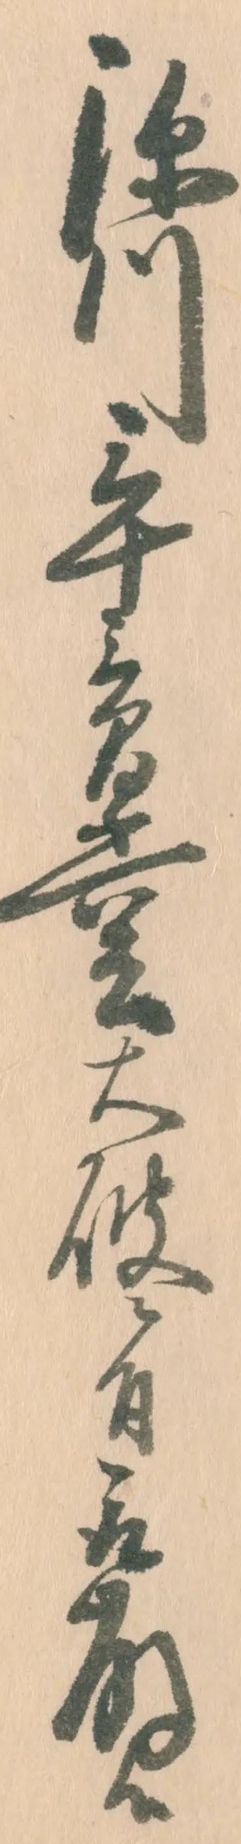深川三十三間大破に付取崩候
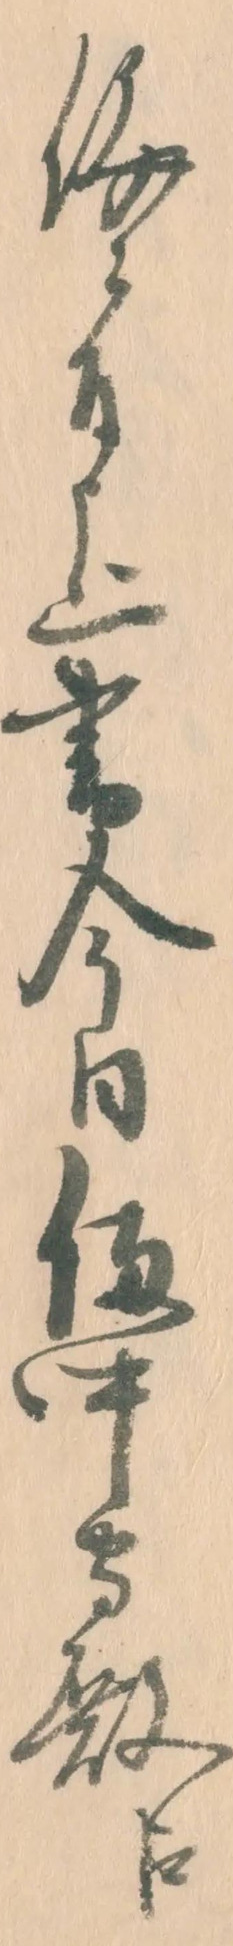儀に付申上書今日備中守殿え

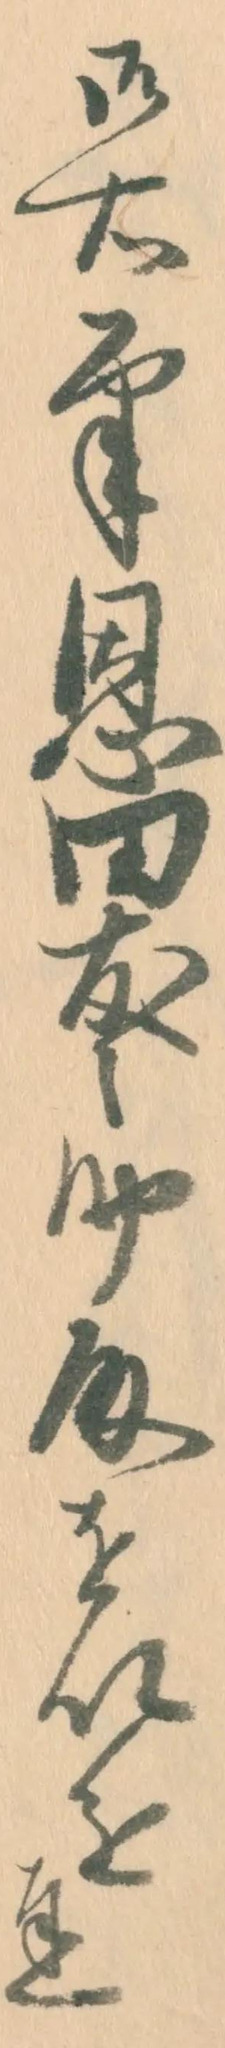御右筆恩田友之助殿を以進達
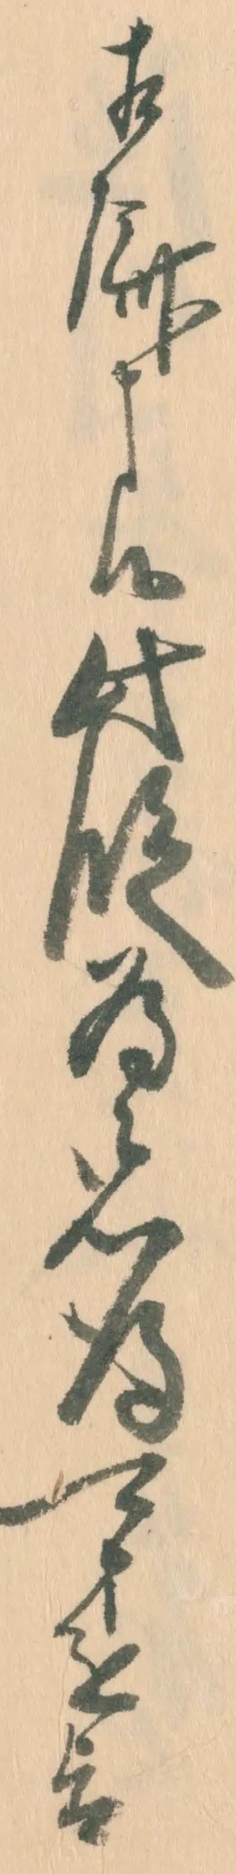相済申候此段為御心得可申進旨
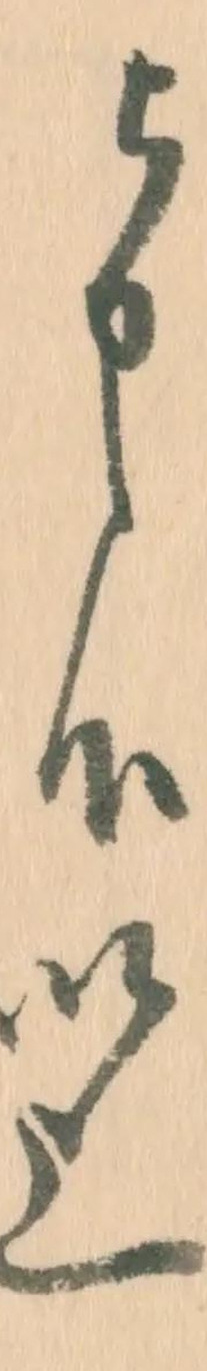被申候以上
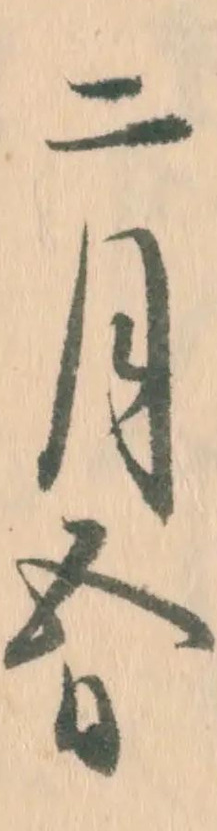二月五日
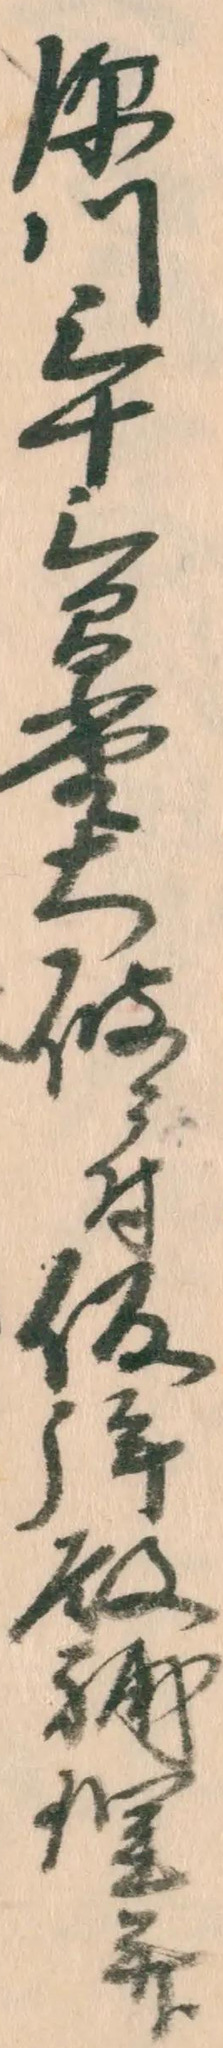│深川三十三間堂大破ニ付仮拜殿補理幷
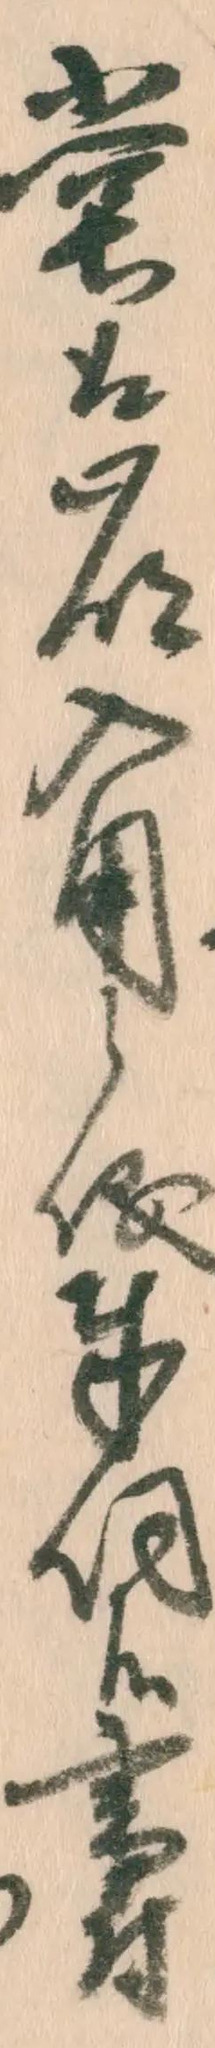│堂取崩入用之儀奉伺候書付
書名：三十三間堂. [1]
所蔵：国立国会図書館 National Diet Library, JAPAN
